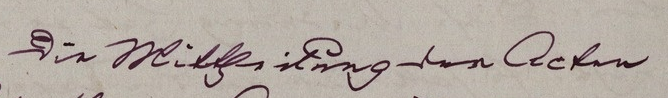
Die Mittheilung der Acten
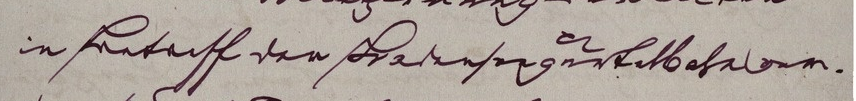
in Betreff der Bodenseegürtelbahn ver-
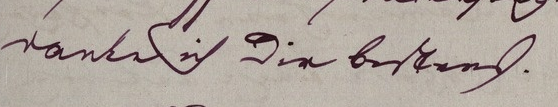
danke ich Dir bestens.
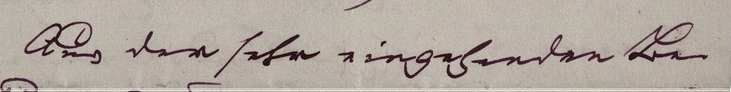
Aus der sehr eingehenden Be-
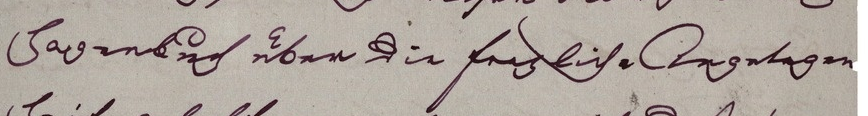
Hagenbuch über die fragliche Angelegen-
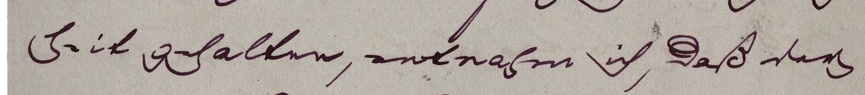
heit gehalten, entnahm ich, daß der
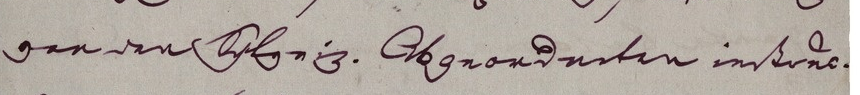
von den Schweiz. Abgeordneten instruc-
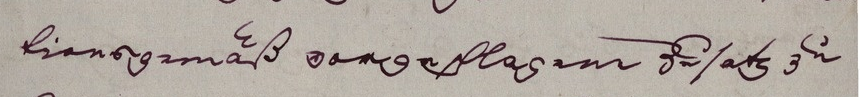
tionsgemäß vorgeschlagene Zusatz zu
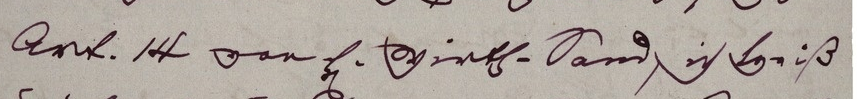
Art. 14 von H. Wirth-Sand, ich weiß
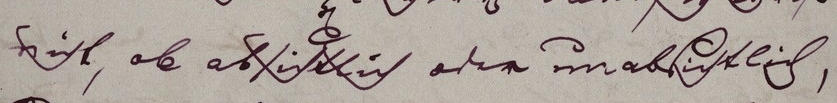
nicht, ob absichtlich oder unabsichtlich,
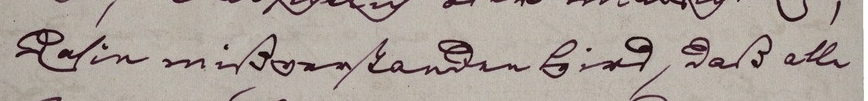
dahin mißverstanden wird, daß alle
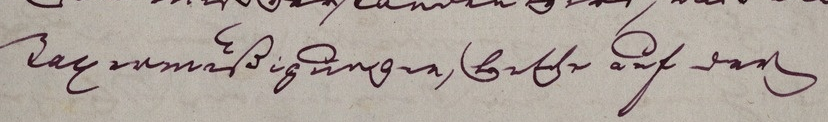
Taxermäßigungen, welche auf der
